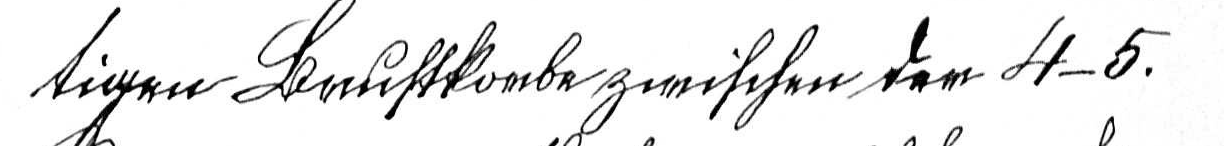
tigen Brustkorbe zwischen der 4-5.
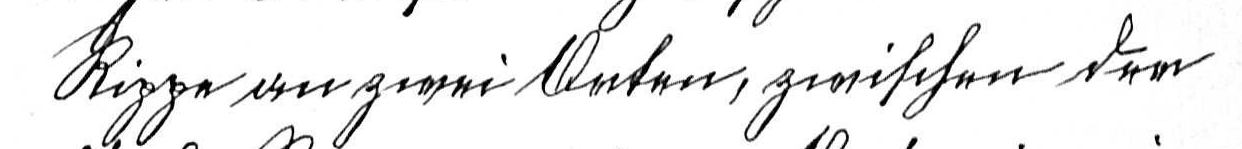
Rippe an zwei Orten, zwischen der
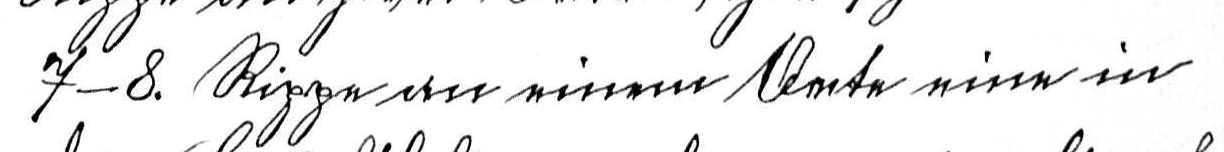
7-8. Rippe an einem Orte eine in
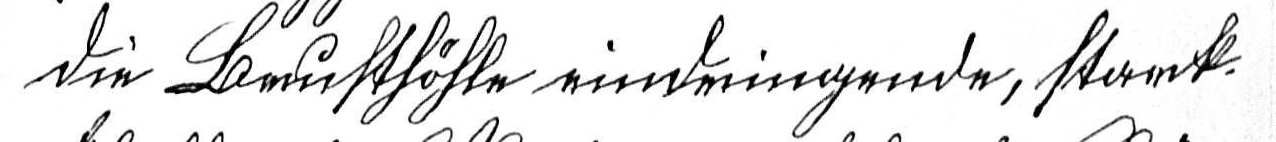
die Brusthöhle eindringende, stark¬
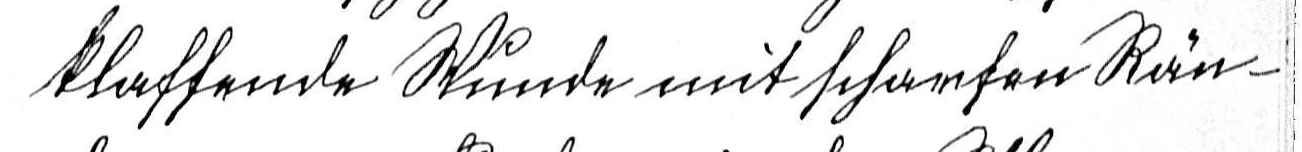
klaffende Wunde mit scharfen Rän¬
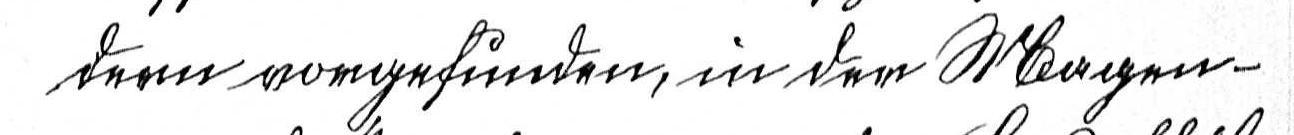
dern vorgefunden, in der Magen¬
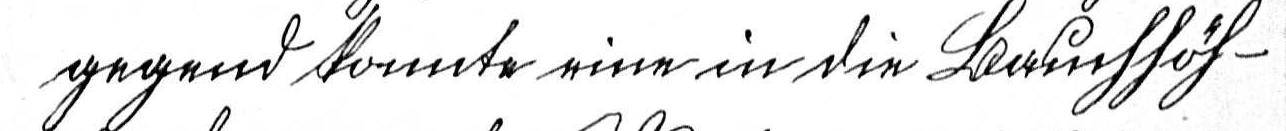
gegend konnte eine in die Bauchhöh¬
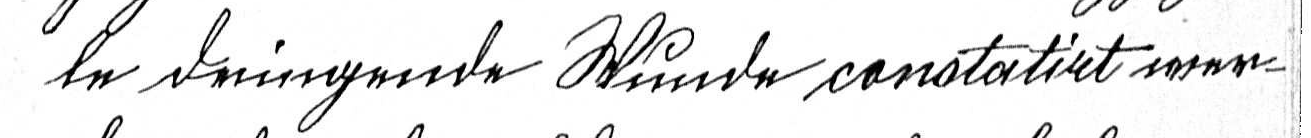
le dringende Wunde constatirt wer¬
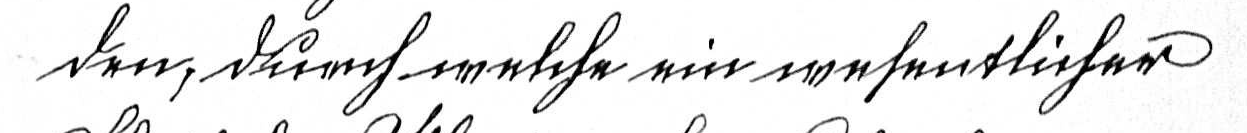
den, durch welche ein wesentlicher
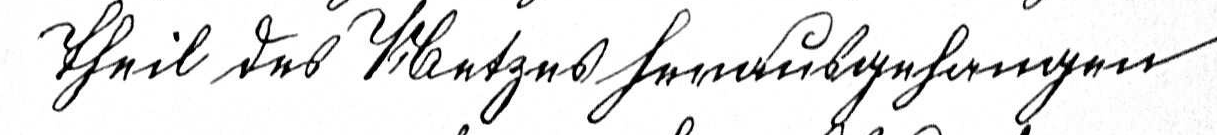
Theil des Netzes herausgehangen
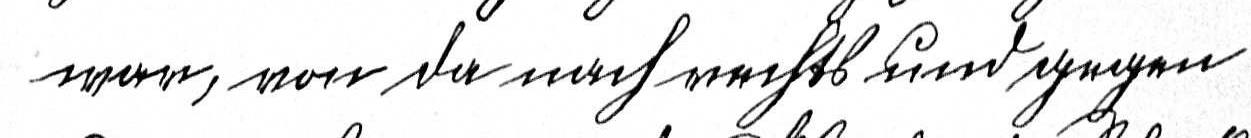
war, von da nach rechts und gegen
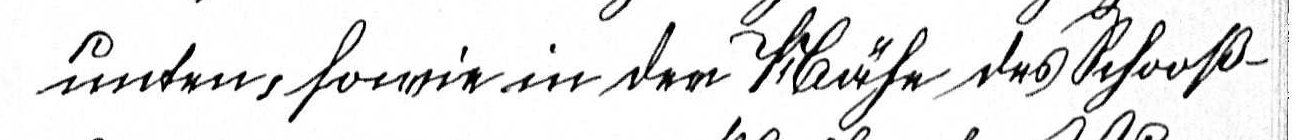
unten, sowie in der Nähe des Schooß¬
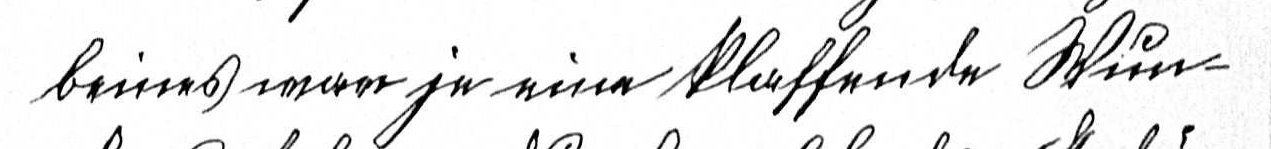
beines war je eine klaffende Wun¬
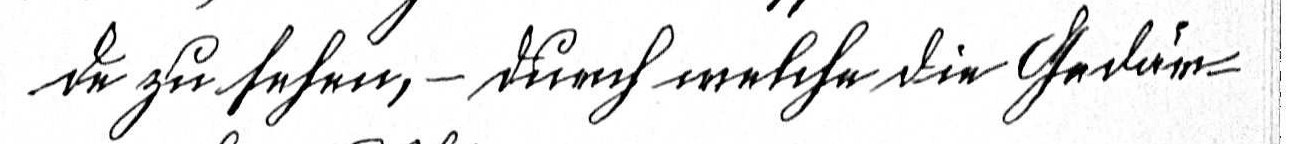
de zu sehen, – durch welche die Gedär¬
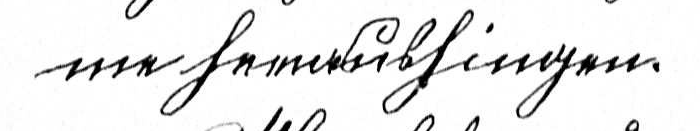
me heraushingen.
